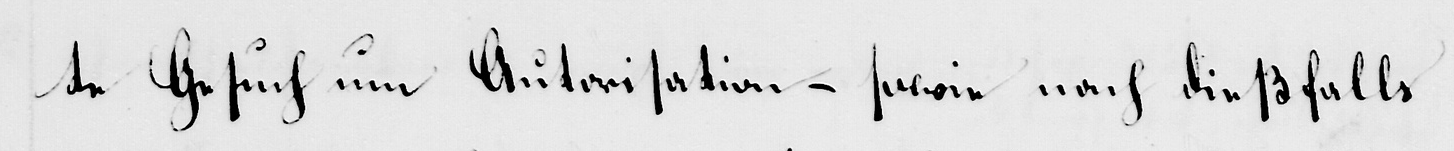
te Gesuch um Autorisation - sowie nach dießfalls
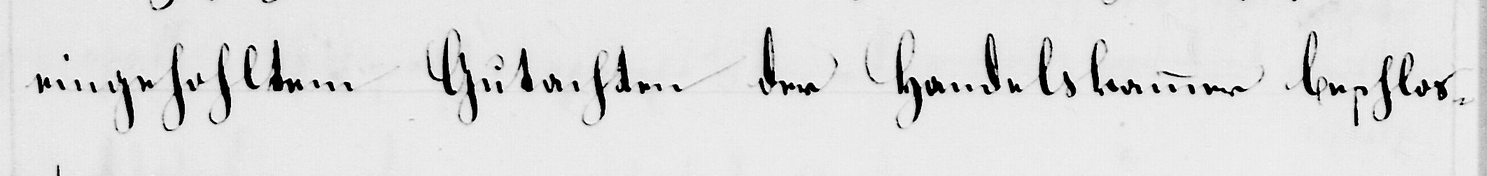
eingeholtem Gutachten der Handelskammer beschlos¬
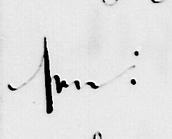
sen:
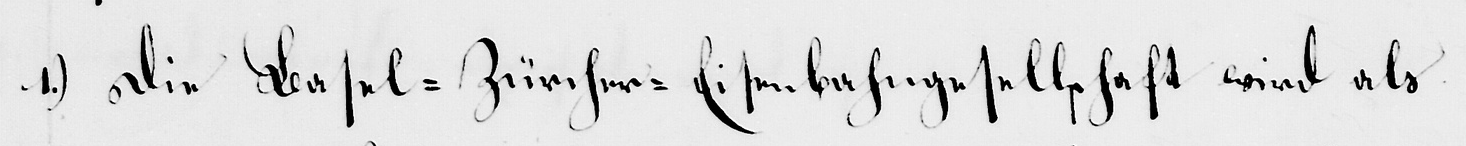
1.) Die Basel-Zürcher-Eisenbahngesellschaft wird als
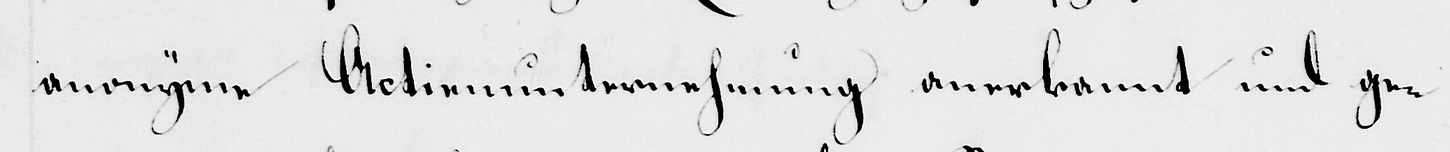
anonyme Actienunternehmung anerkannt und ge¬
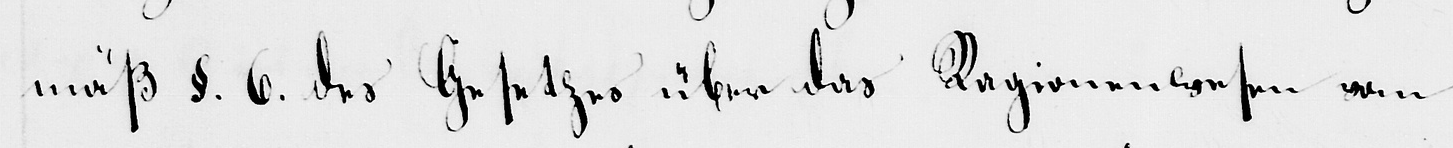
mäß § 6. des Gesetzes über das Regionenwesen vom
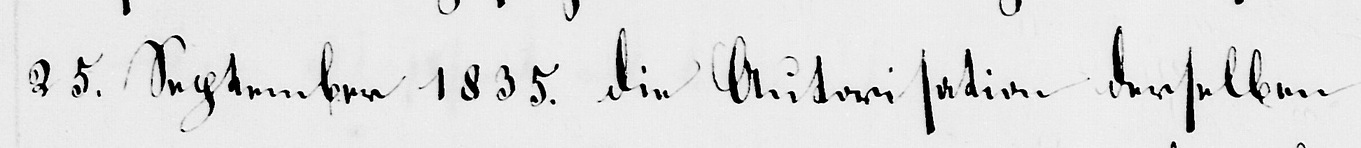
25. September 1835. die Autorisation derselben
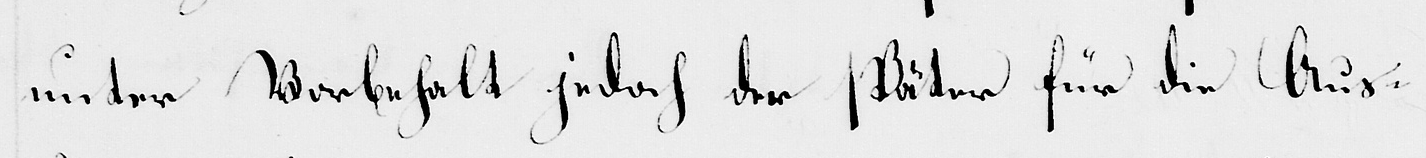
unter Vorbehalt jedoch der später für die Aus¬
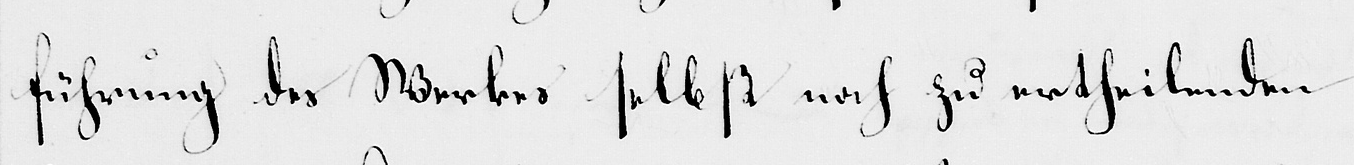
führung des Werkes selbst noch zu ertheilenden
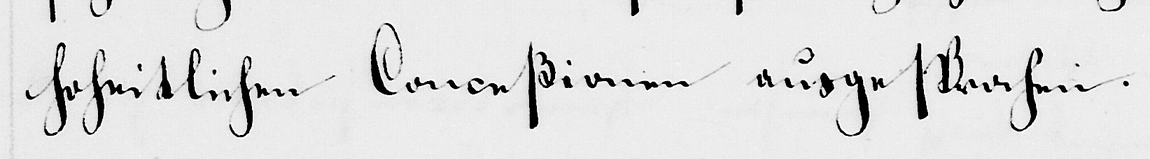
hoheitlichen Conceßionen ausgesprochen.
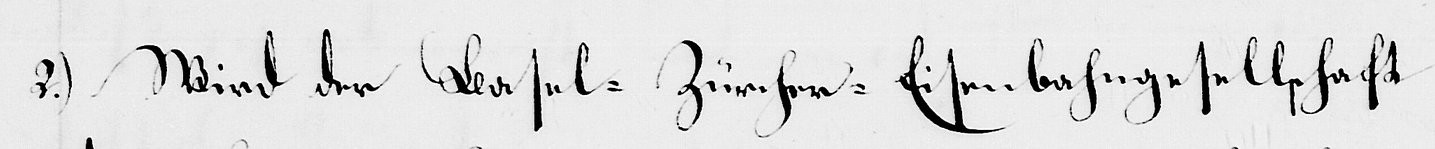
2.) Wird der Basel-Zürcher-Eisenbahngesellschaft
